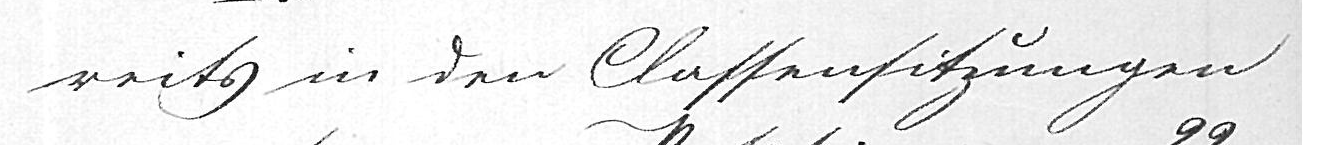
reits in den Classensitzungen
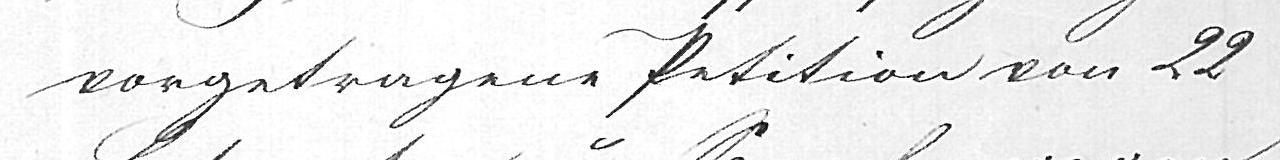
vorgetragen Petition von 22
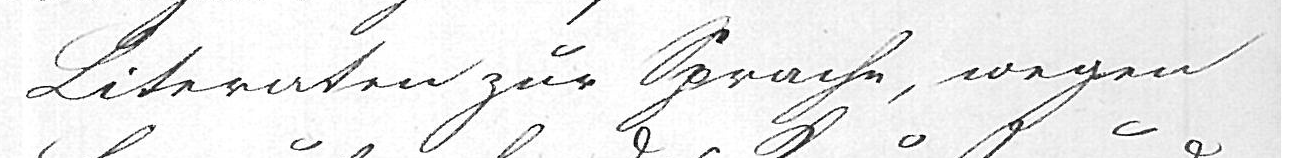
Literaten zur Sprache, wegen
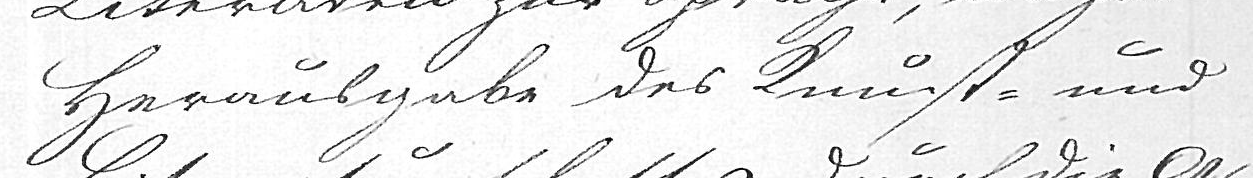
Herausgabe des Kunst- und
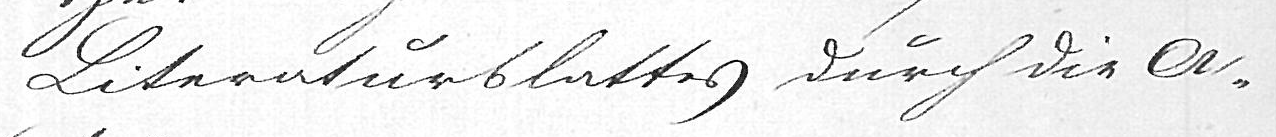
Literaturblattes durch die A-
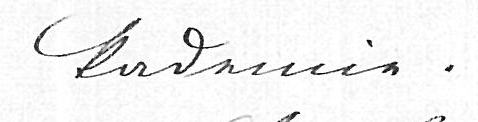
kademie.
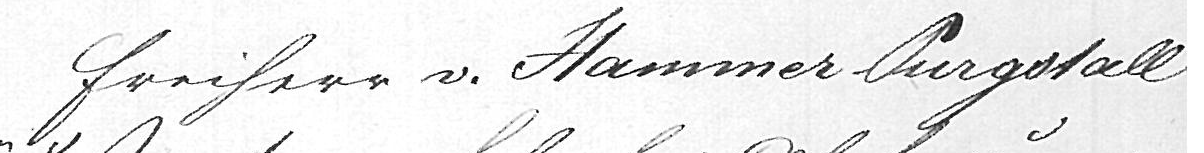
Freiherr v. Hammer-Purgstall
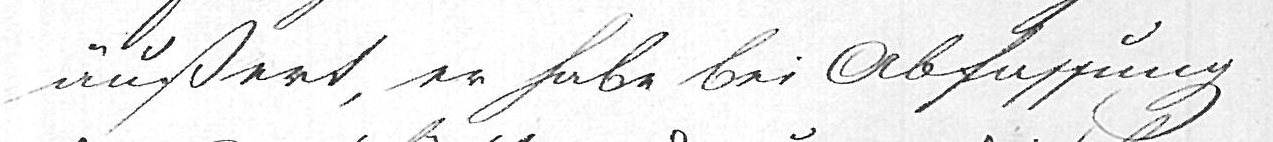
äußert, er habe bei Abfassung
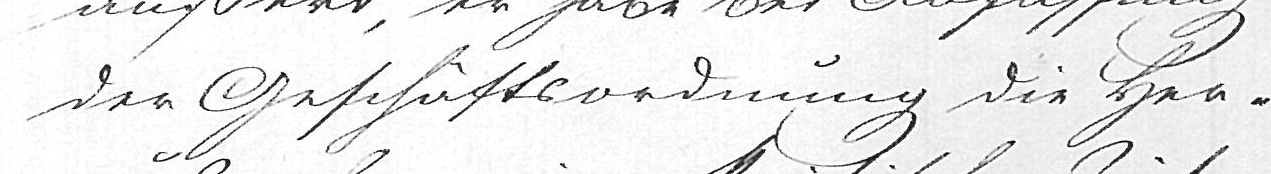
der Geschäftsordnung die Her-
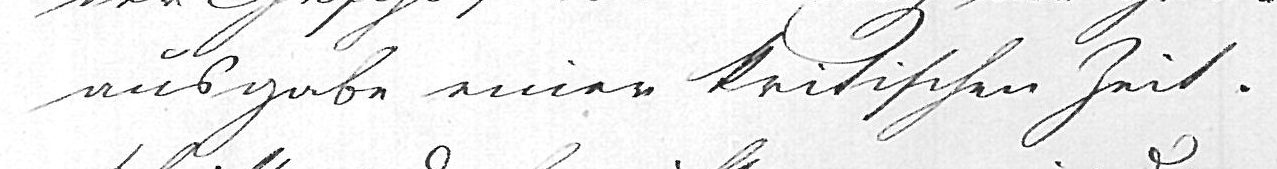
ausgabe einer kritischen Zeit-
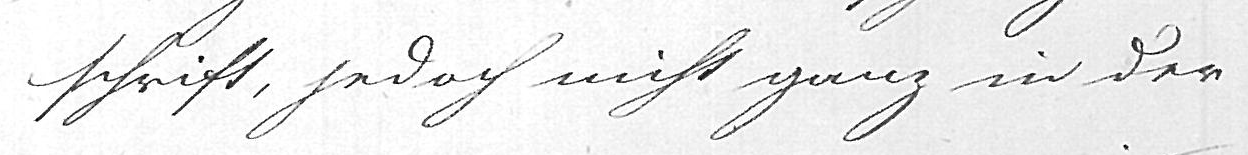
schrift, jedoch nicht ganz in der
